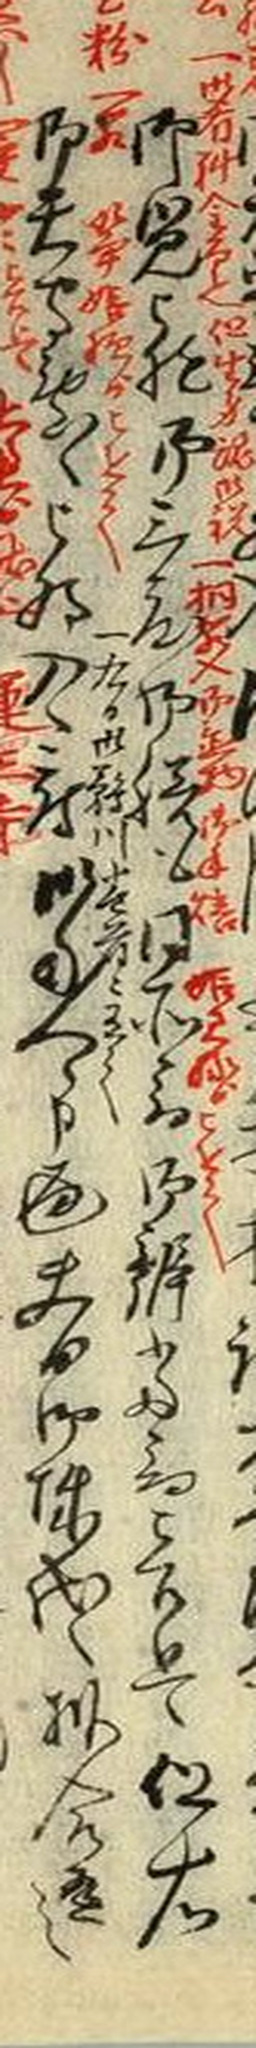御天守台へ被為入候ニ付御用人へ申通夫ゟ御城代へ掛合有之
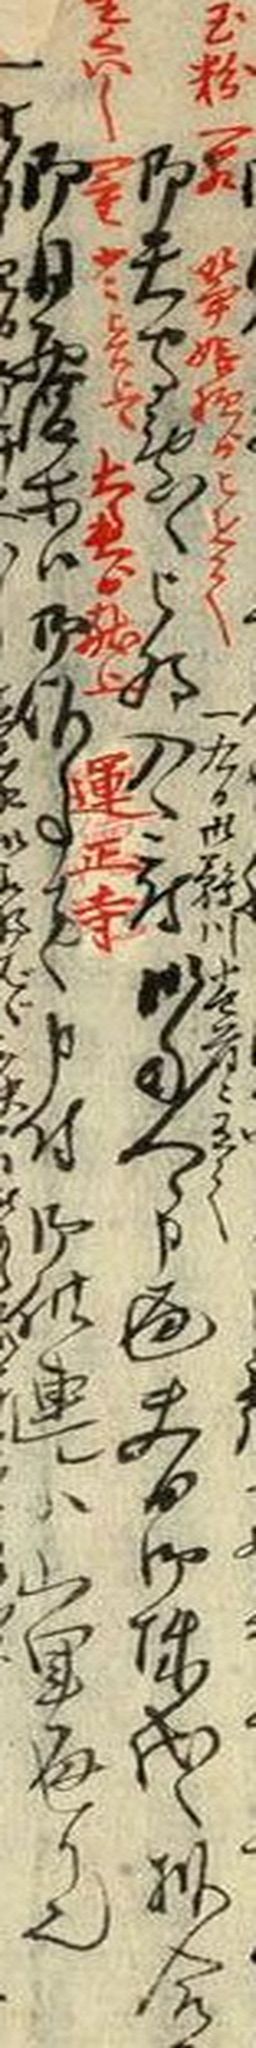御日覆等ハ御作事方へ申付御供連レハ山里通り也
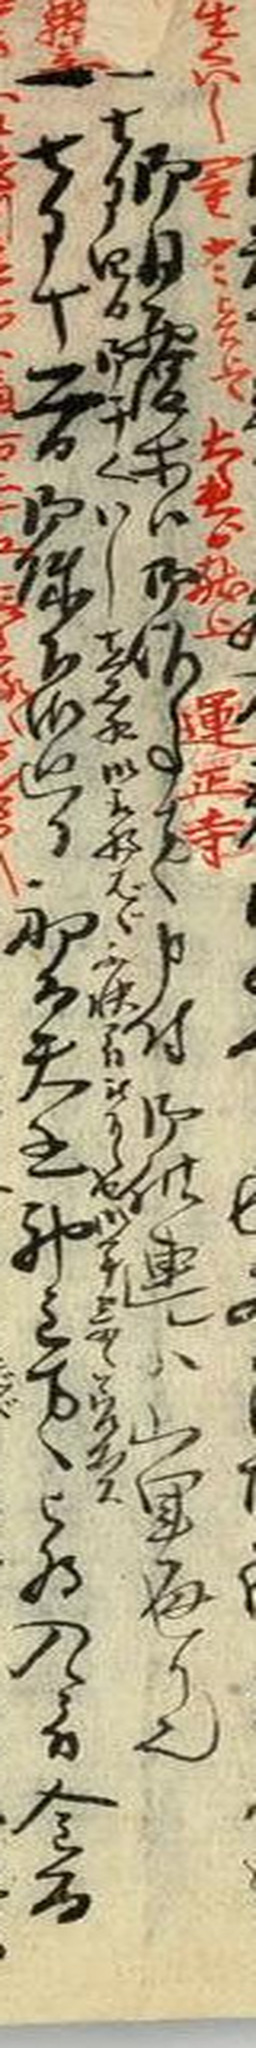一七月十二日御城下御廻り初而天王神主方へ被為入候ニ付金百
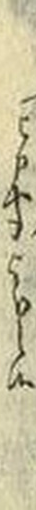被申聞被下之候
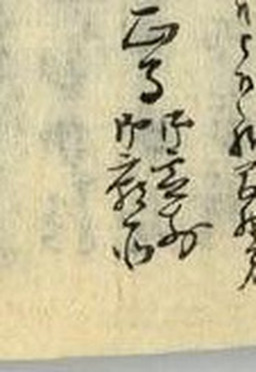御廟所
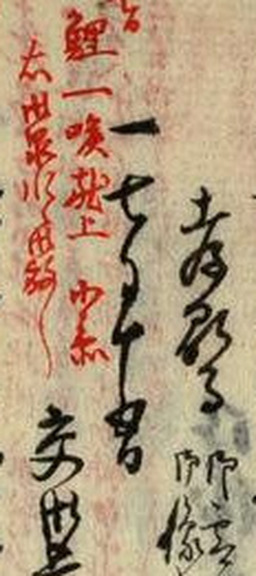一七月十五日
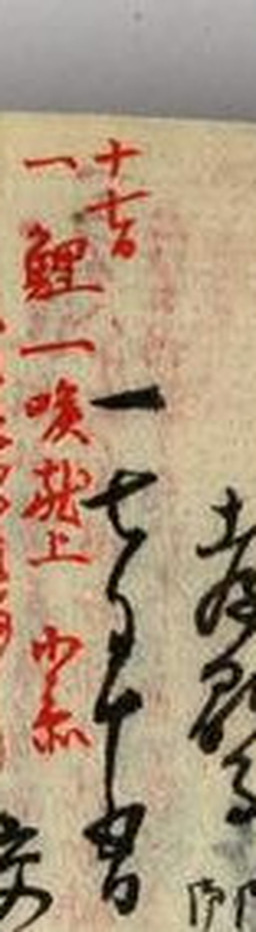一鯉一喉献上小兵衛
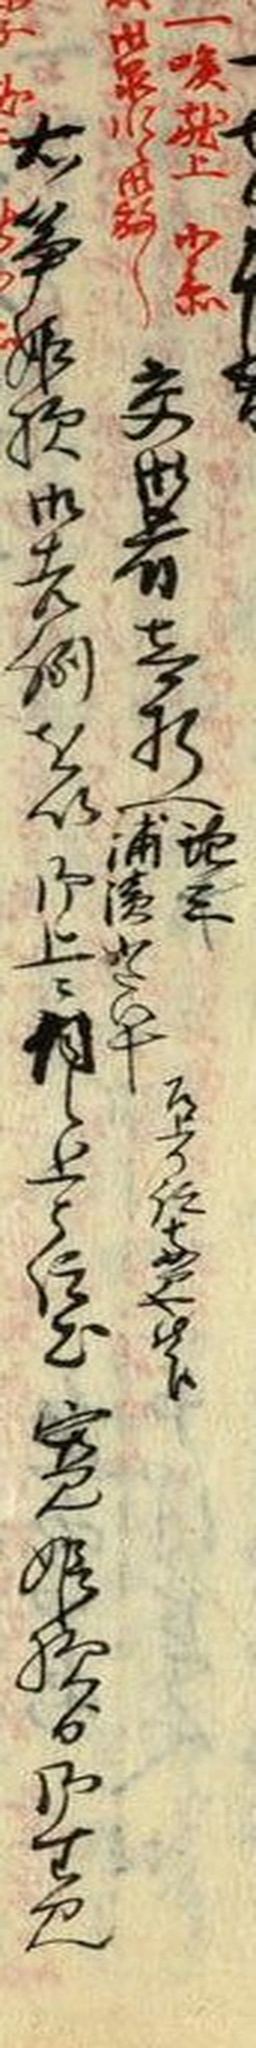右箏姫様御吉例を以御上ニ伺之上被仰出寛姫様ゟ御生見
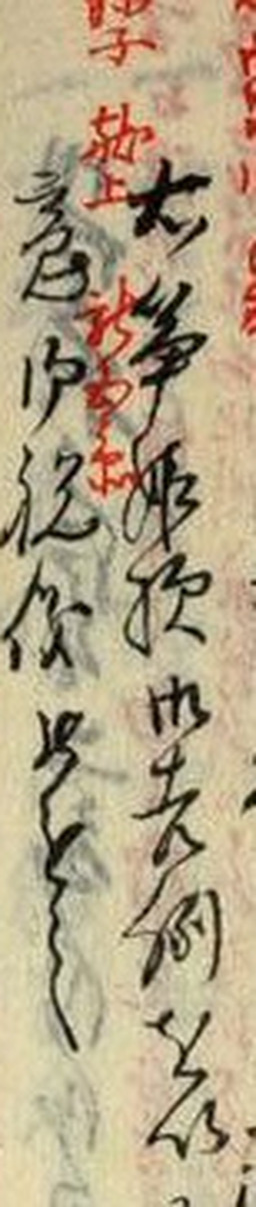魂御祝儀被進之
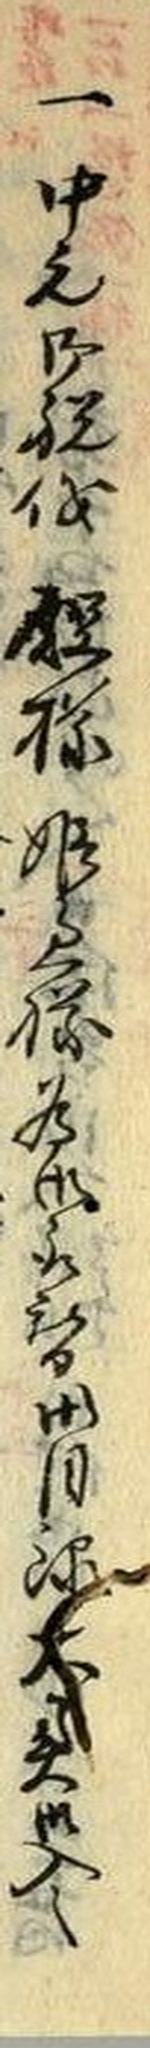一中元御祝儀殿様姫君為御取替御目録大奥御入之
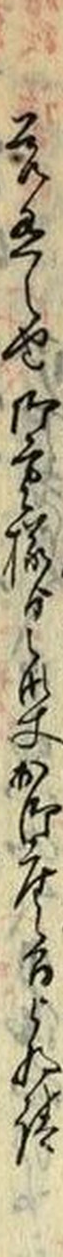節有之由御方々様ゟ之御使於御座之間被為請
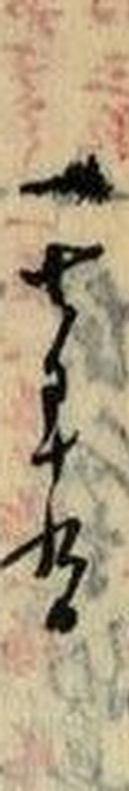一七月十九日
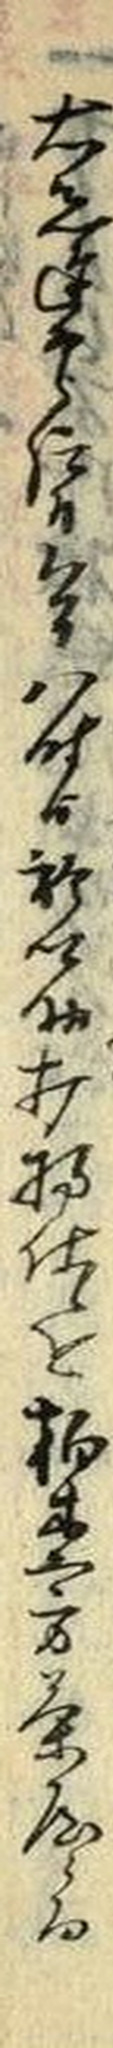右先達而被仰付今日八時ゟ打揚仕候を狛木工方茶屋ニ而
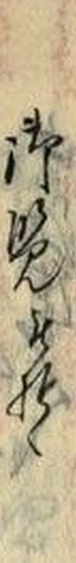御覧被遊候
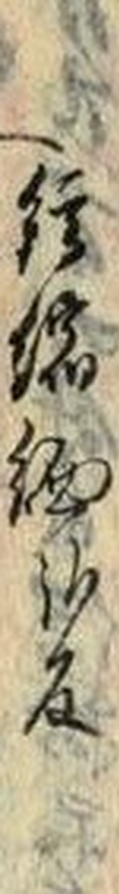縞縮緬弐反
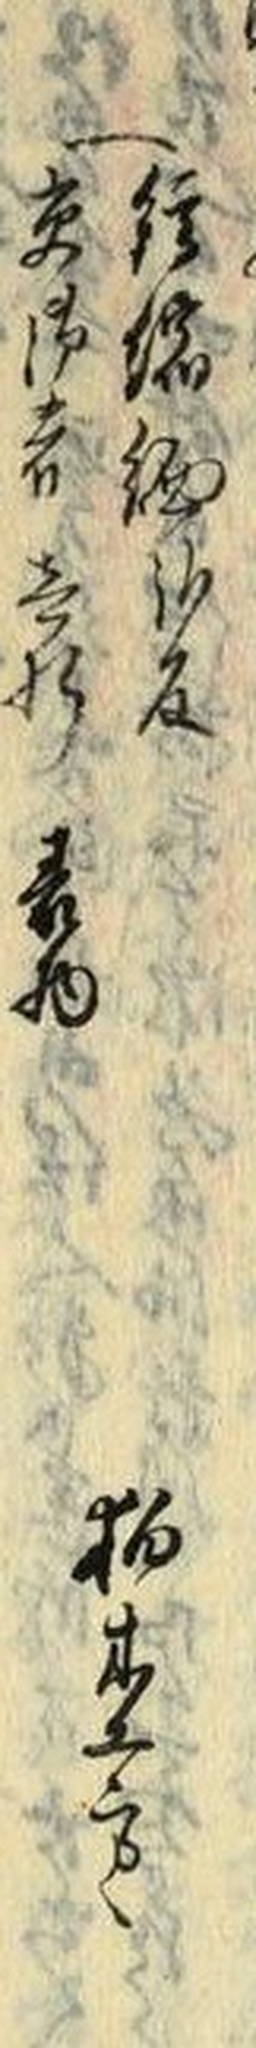交御肴壱折表物狛木工方へ
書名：少傅日録抄（斉承付側向頭取日記、在国）
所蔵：福井県文書館 Fukui Prefectural Archives
